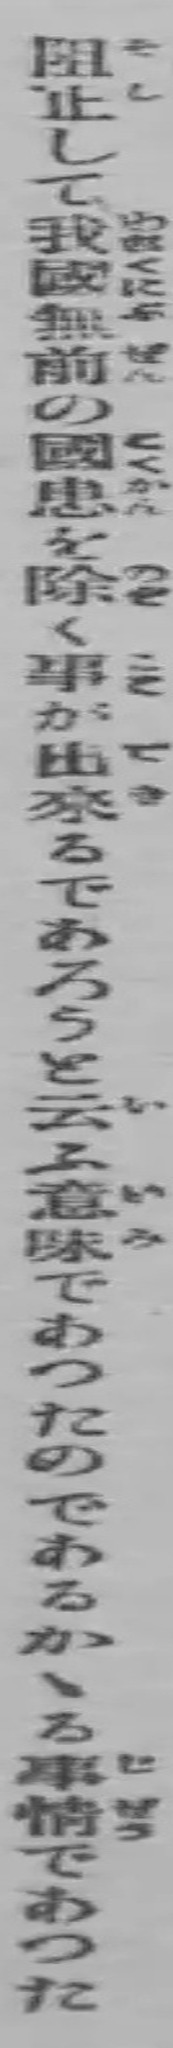阻止して我国無前の国患を除く事が出来るであろうと云ふ意味であつたのであるかゝる事情であつた
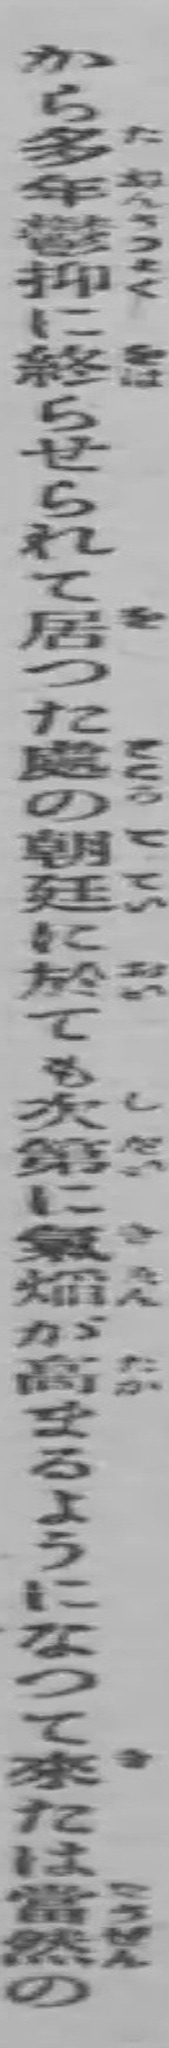から多年鬱抑に終らせられて居つた処の朝廷に於ても次第に気焔が高まるようになつて来たは当然の
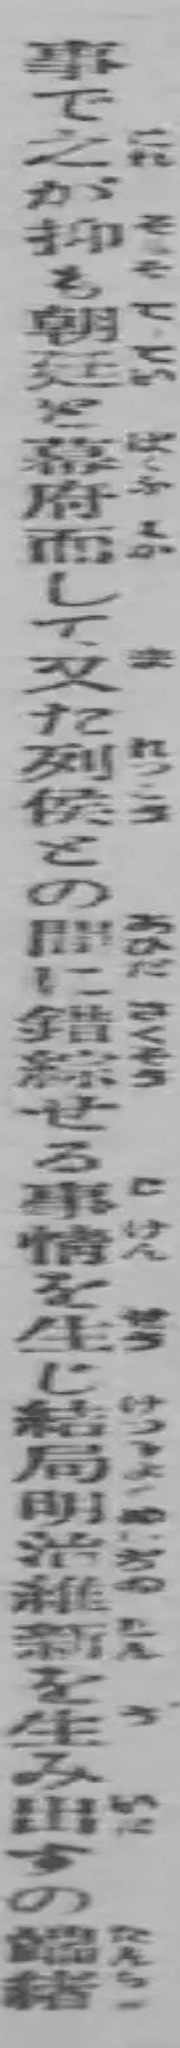事で之が抑も朝廷と幕府而して又た列侯との間に錯綜せる事情を生じ結局明治維新を生み出すの端緒
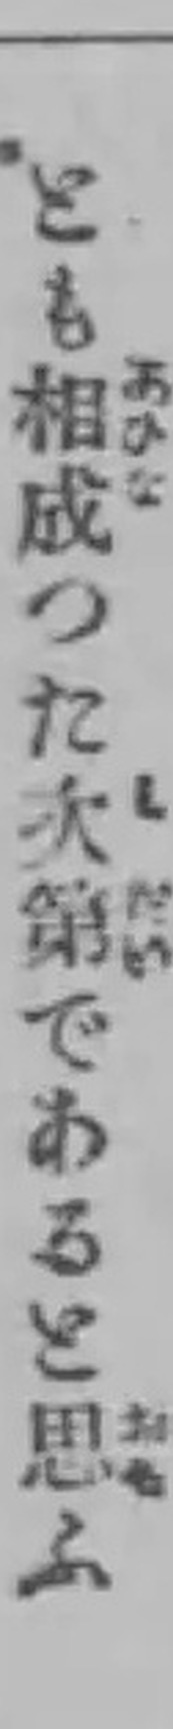とも相成つた次第であると思ふ
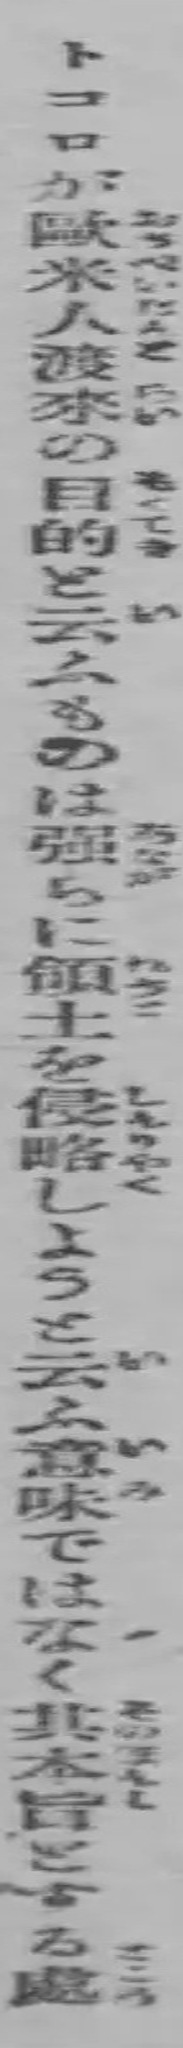トコロが欧米人渡来の目的と云ふものは強ちに領土を侵略しようと云ふ意味ではなく其本旨とする処
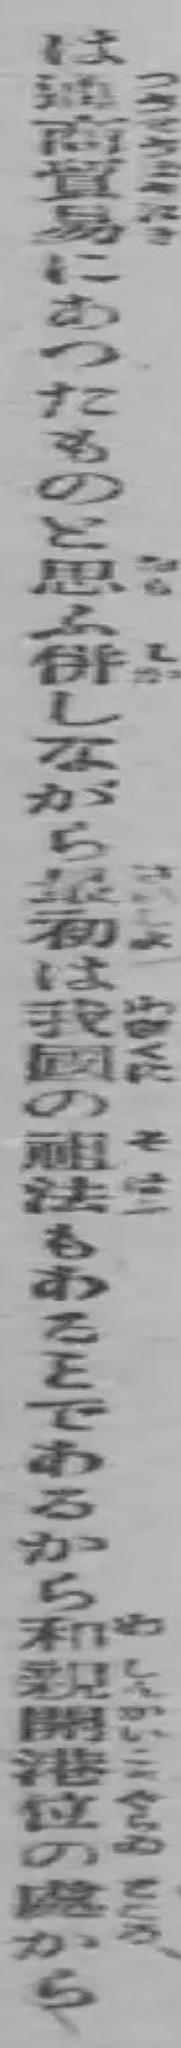は通商貿易にあつたものと思ふ併しながら最初は我国の祖法もあることであるから和親開港位の処から

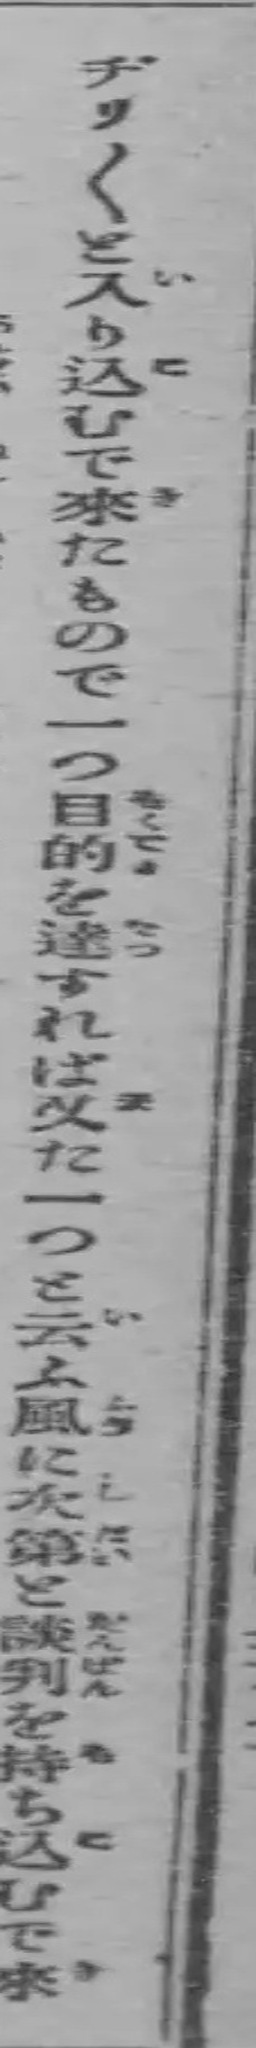ヂリ〳〵と入り込むで来たもので一つ目的を達すれば又た一つと云ふ風に次第と談判を持ち込むで来
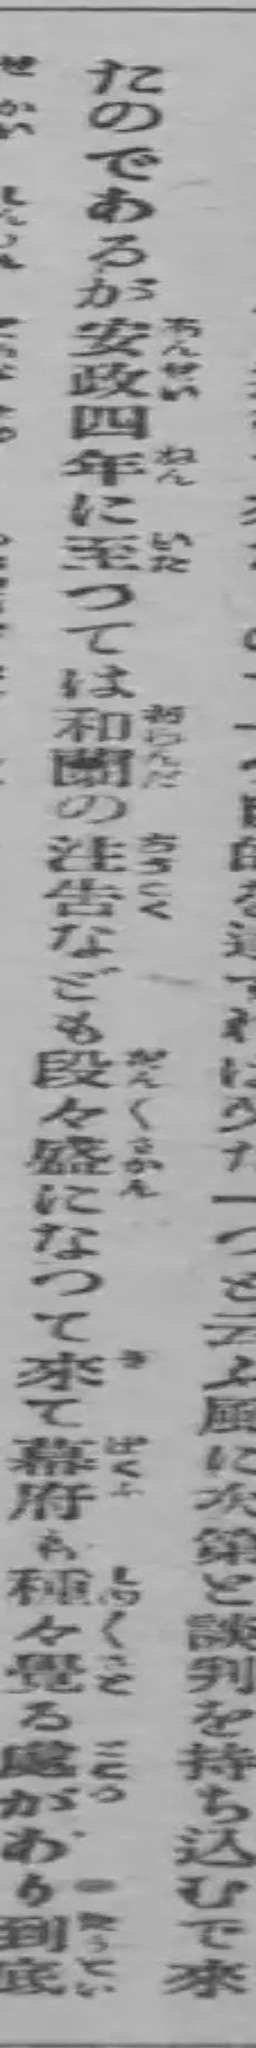たのであるが安政四年に至つては和蘭の注告なども段々盛になつて来て幕府も種々覚る処があり到底
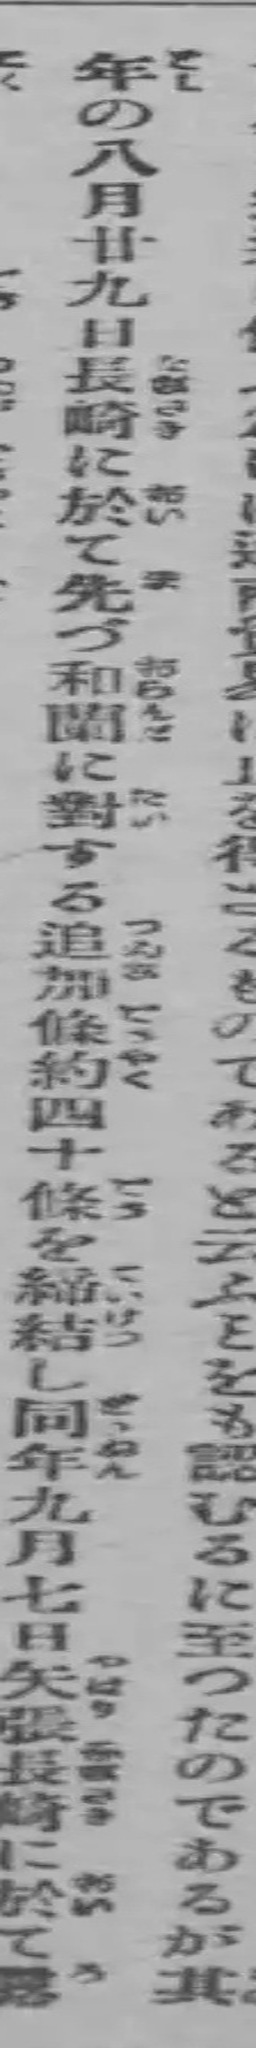年の八月廿九日長崎に於て先づ和蘭に対する追加条約四十条を締結し同年九月七日矢張長崎に於て露
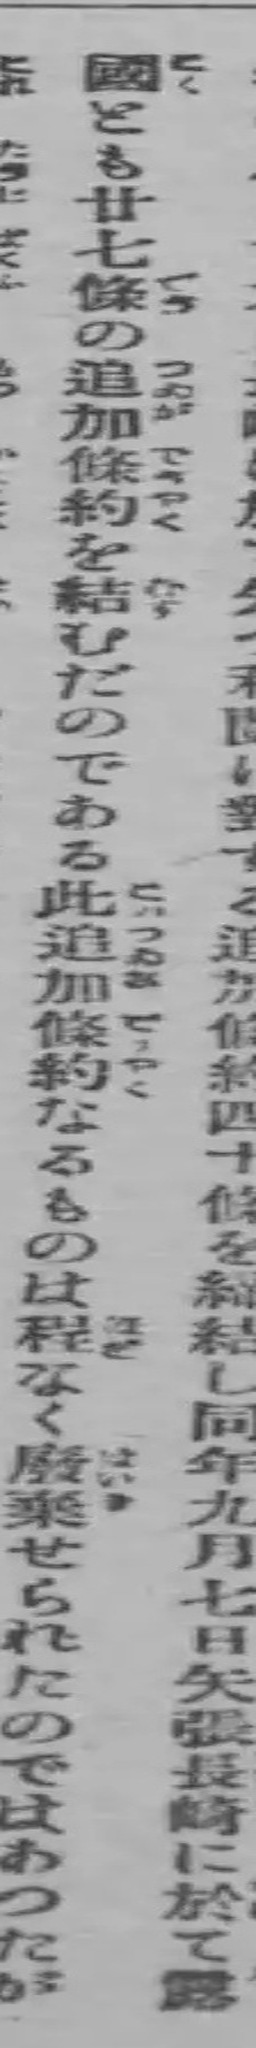国とも廿七条の追加条約を結むだのである此追加条約なるものは程なく廃棄せられたのではあつたが
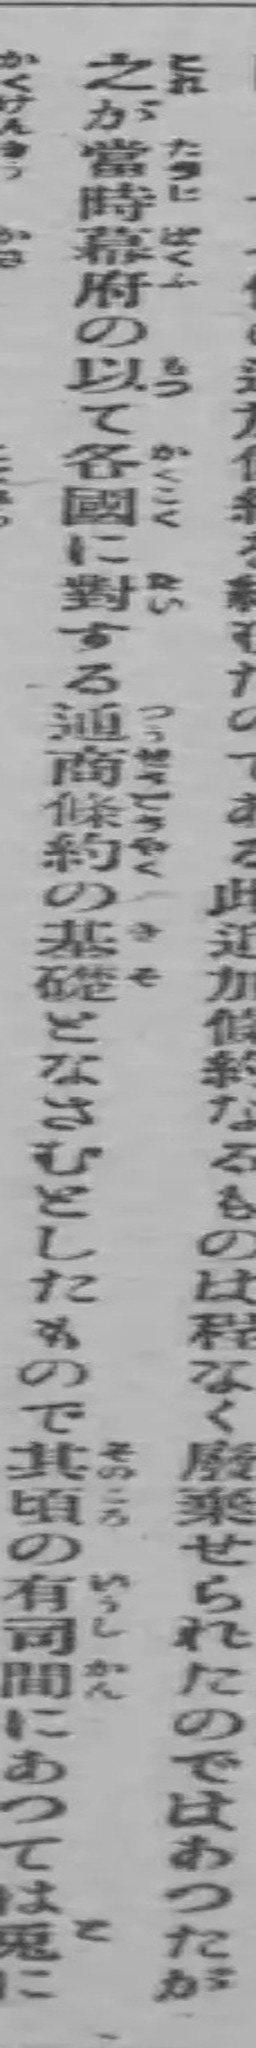之が当時幕府の以て各国に対する通商条約の基礎となさむとしたもので其頃の有司間にあつては兎に
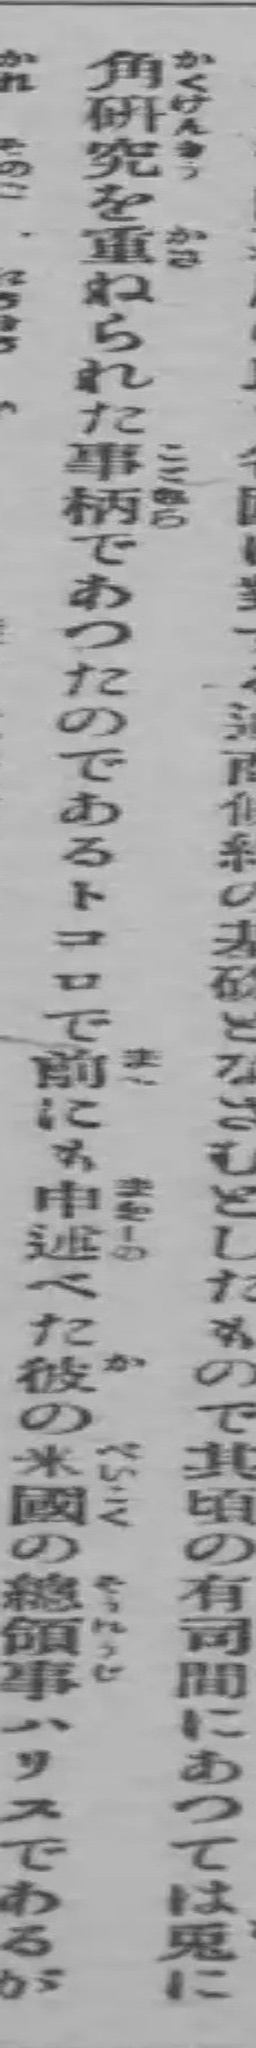角研究を重ねられた事柄であつたのであるトコロで前にも申述べた彼の米国の総領事ハリスであるが
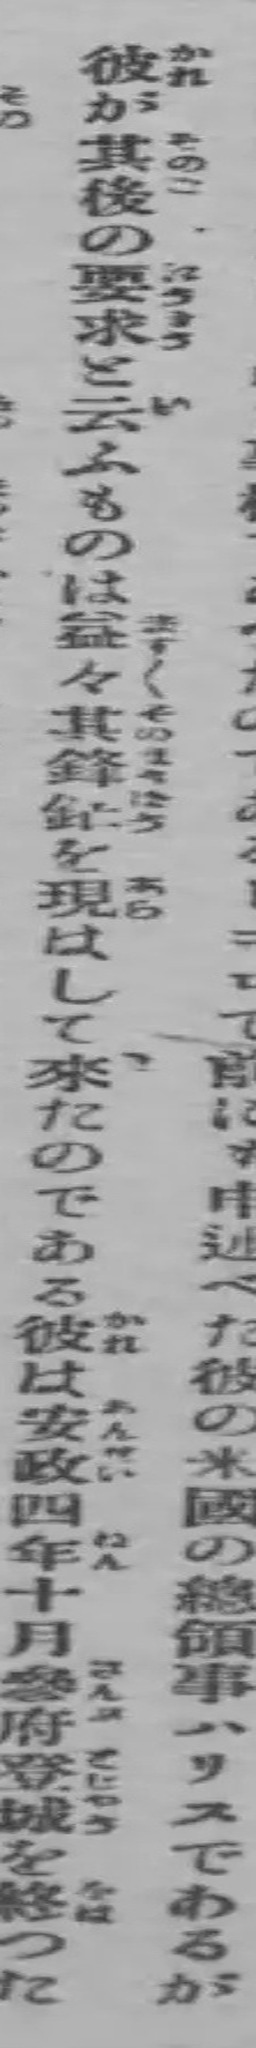彼が其後の要求と云ふものは益々其鋒鋩を現はして来たのである彼は安政四年十月参府登城を終つた
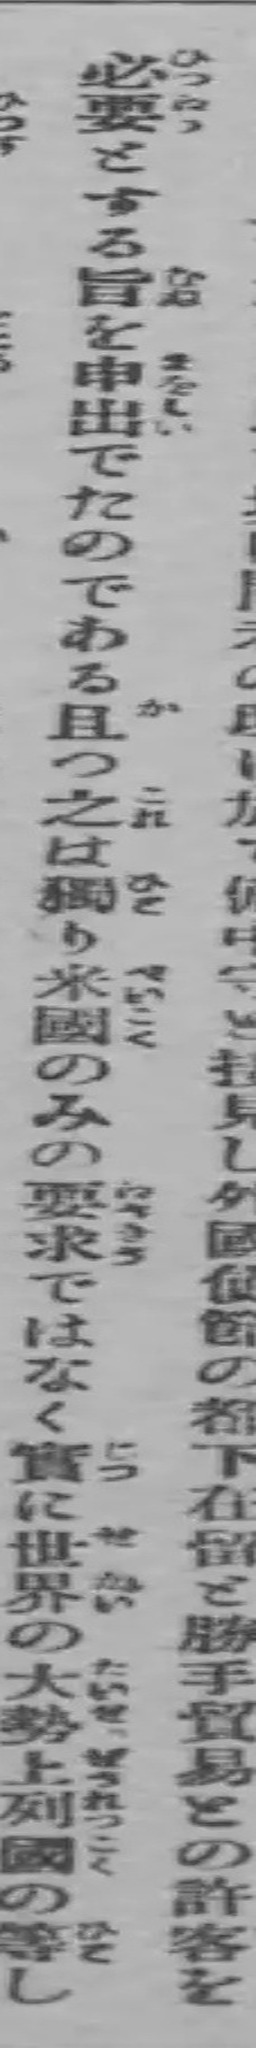必要とする旨を申出でたのである且つ之は独り米国のみの要求ではなく実に世界の大勢上列国の等し
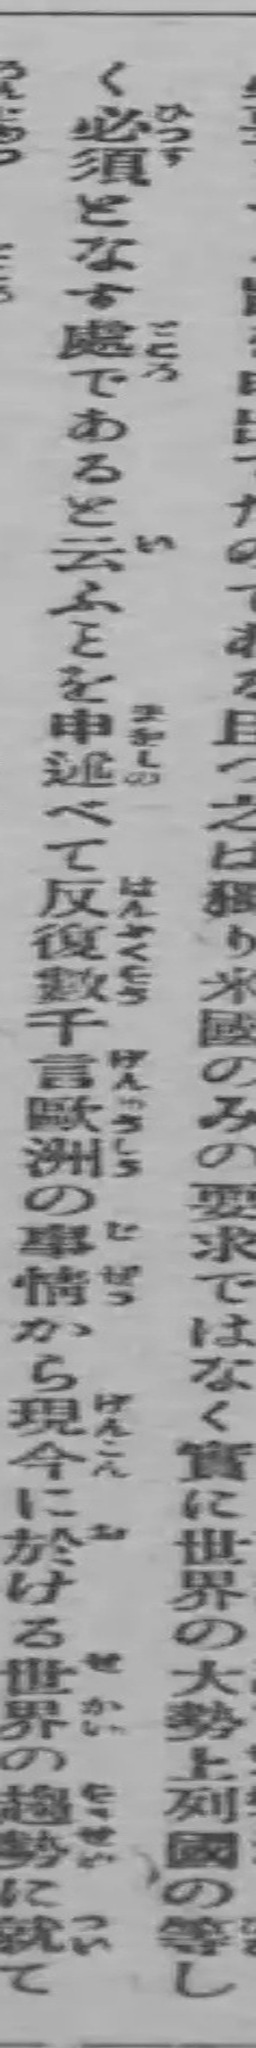く必須となす処であると云ふことを申述べて反復数千言欧洲の事情から現今に於ける世界の趨勢に就て
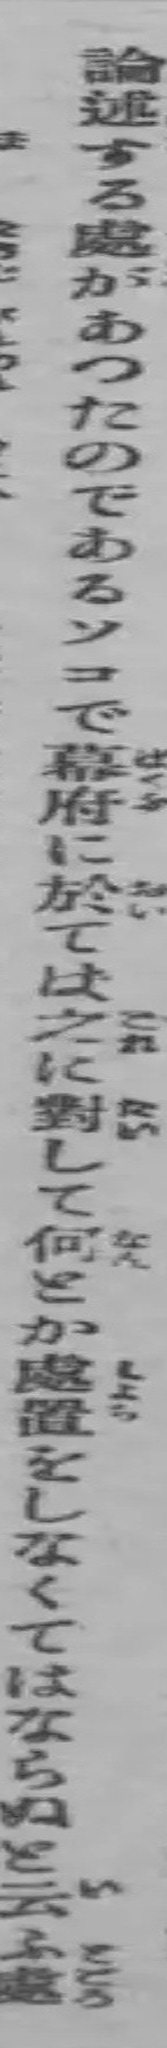論述する処があつたのであるソコで幕府に於ては之に対して何とか処置をしなくてはならぬと云ふ処
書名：豊橋市史談
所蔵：国立国会図書館 National Diet Library, JAPAN
